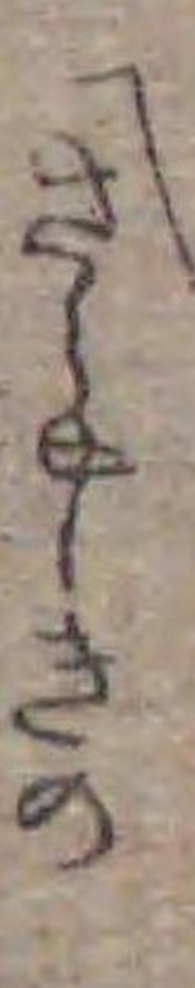〽さらやしきの
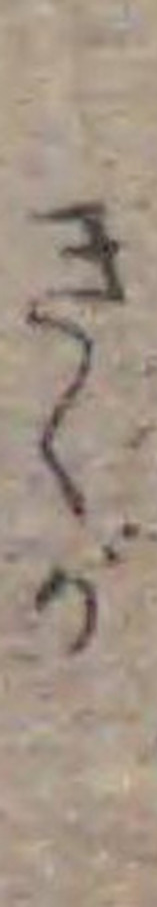きくが
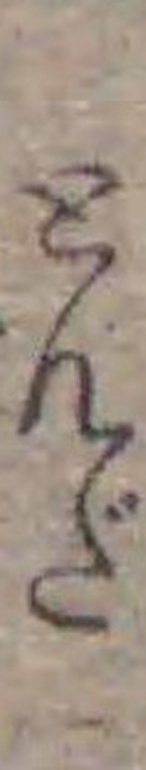とんだ
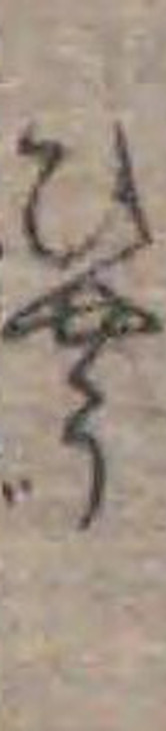ひやう
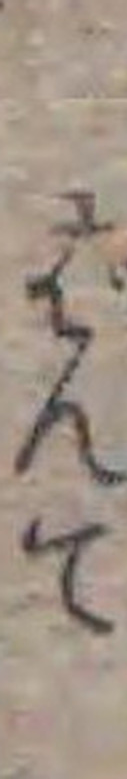ばんで
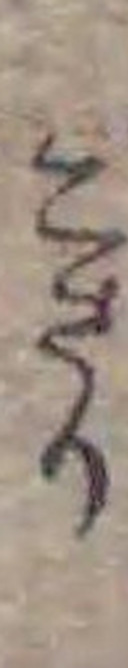ごさり
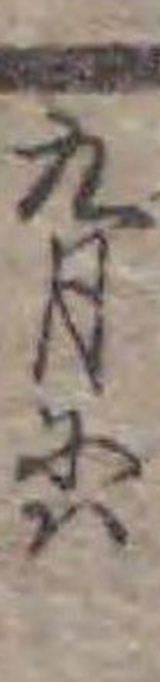九月には
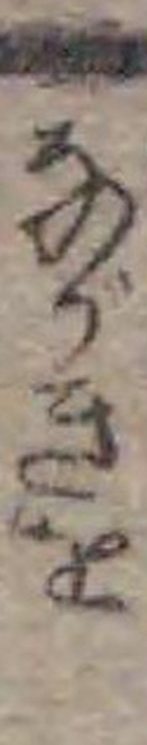ながきを
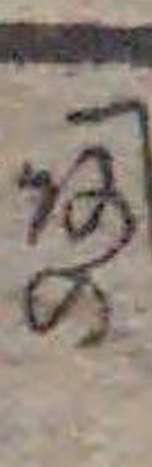〽何の
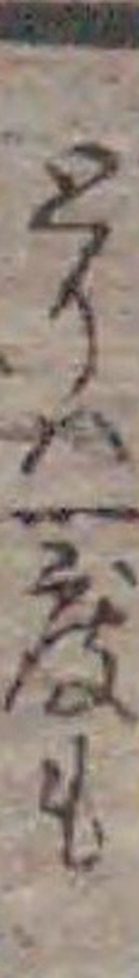とりは一度も
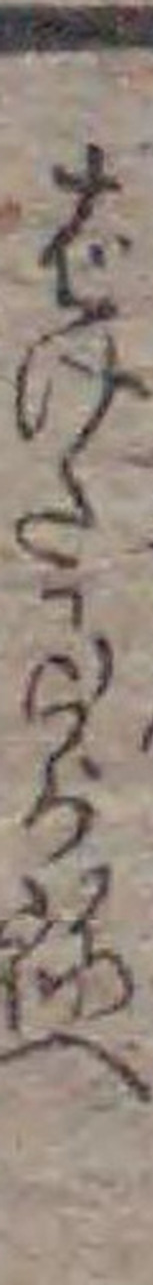ばけた事がねへ
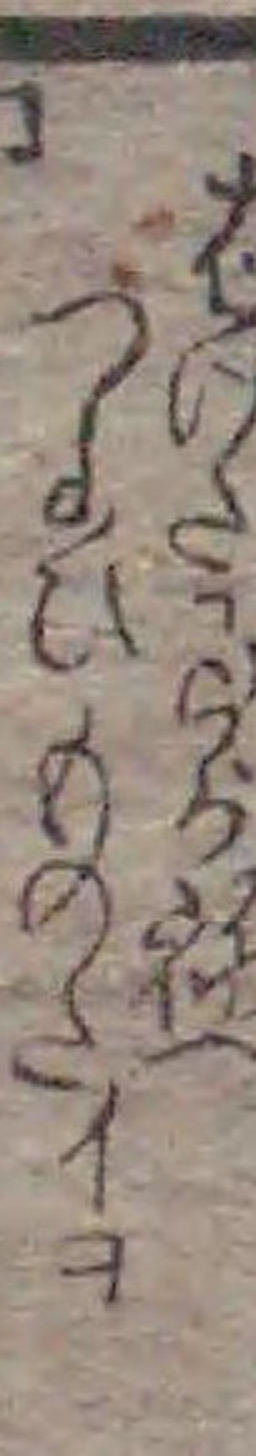つよひものたイヲ
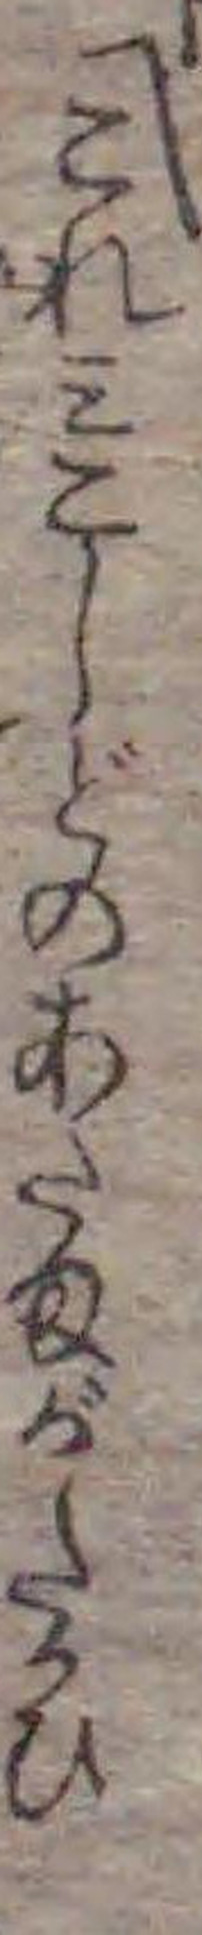〽これみこしどのあたまがたかひ
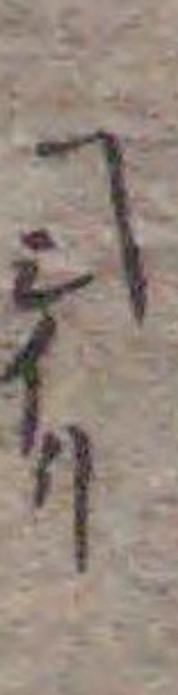〽シイ引
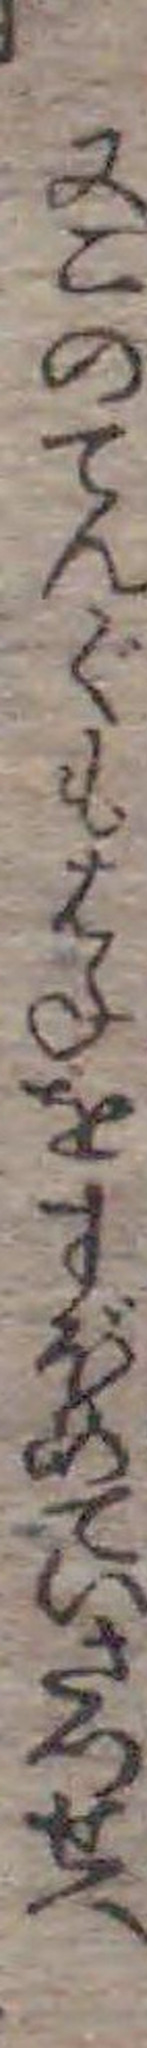又このてんぐもはねをすぼめていさつせへ
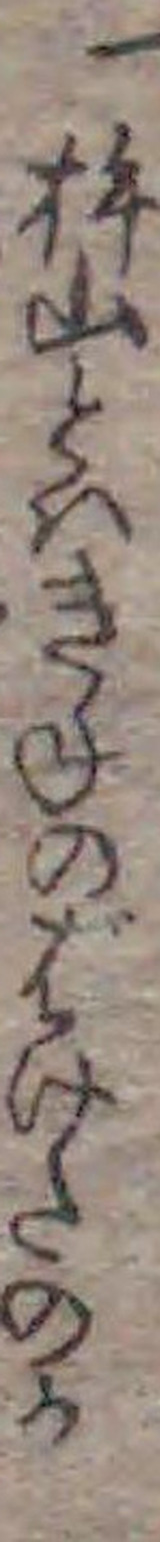〽杵山とはきねのばけたのか
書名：年中行状記 : 2巻
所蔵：国立国会図書館 National Diet Library, JAPAN
